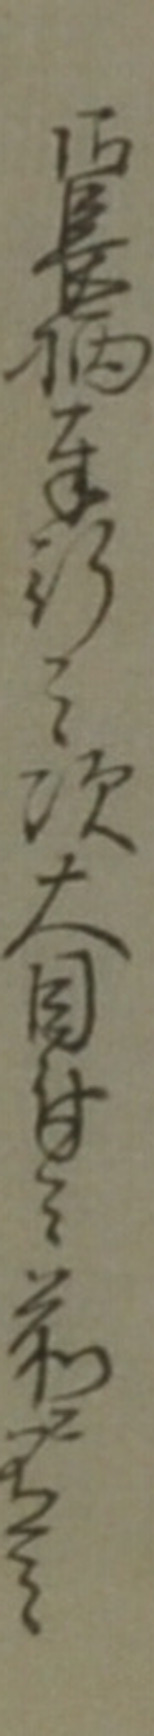御長柄奉行之次大目付之前ニ有之
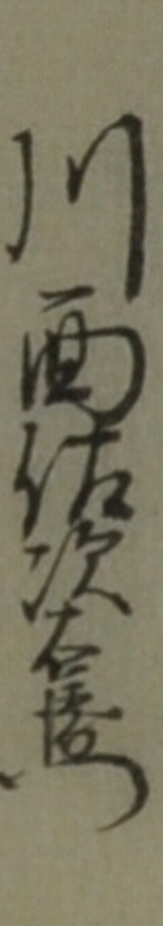川面佐次右衛門
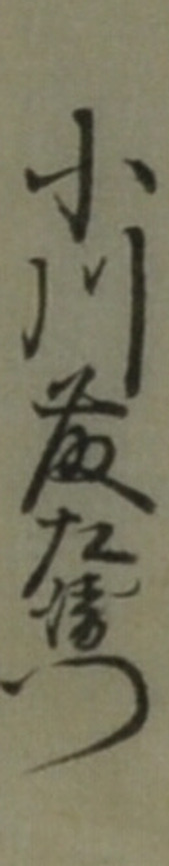小川藤左衛門
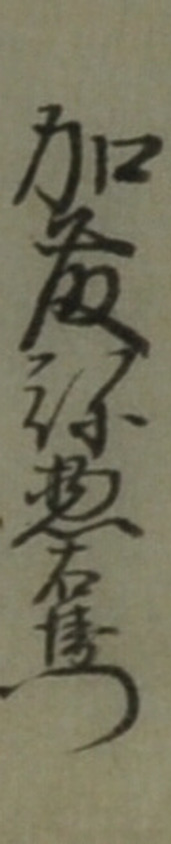加藤弥惣右衛門

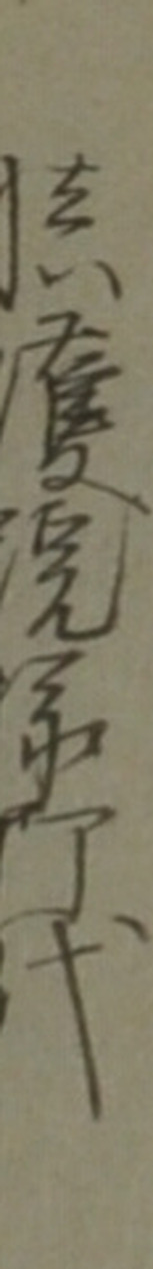慎護院様御代
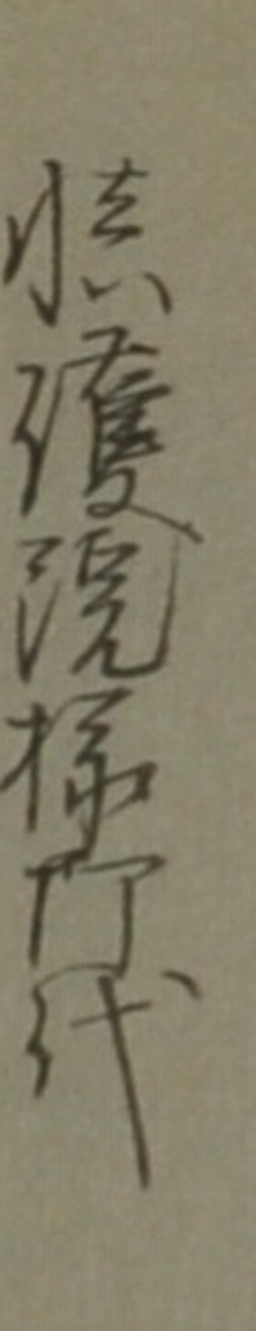慎護院様御代
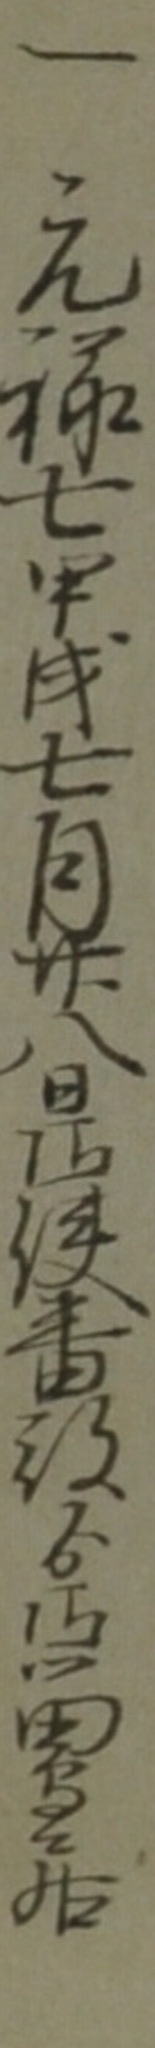一元禄七甲戌七月廿八日御使番役ゟ御留守居
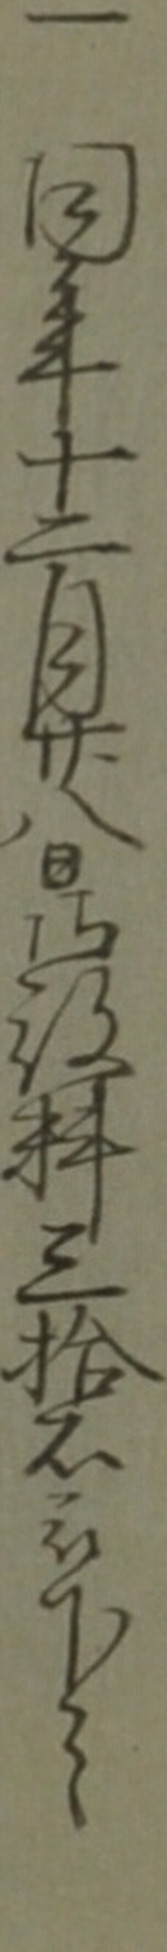一同年十二月廿八日御役料三拾石被下之
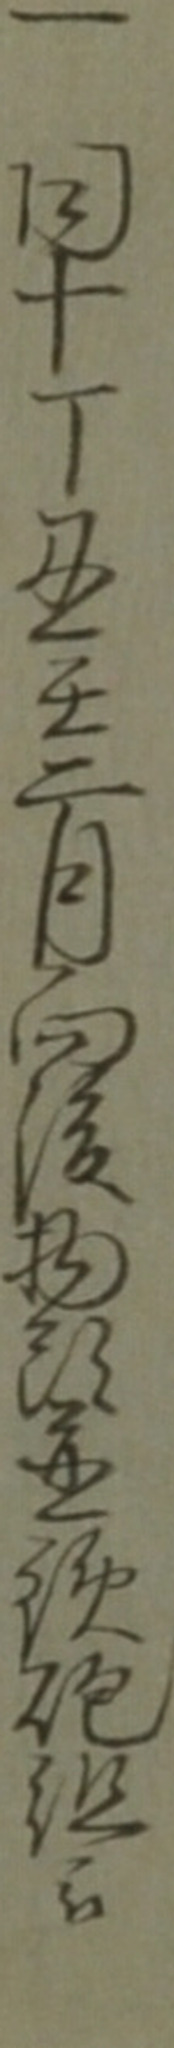一同十丁丑閏二月向後物頭並鉄砲組被
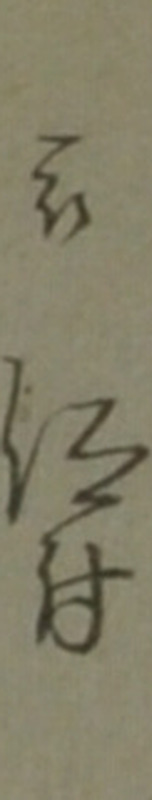被仰付
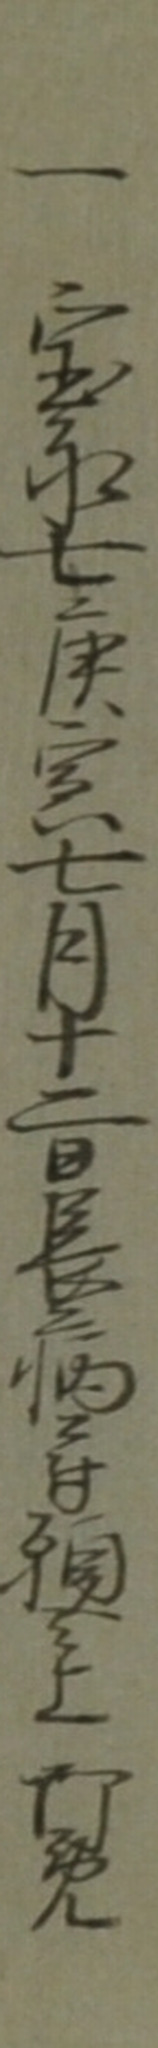一宝永七庚寅七月十二日長病ニ付願之上御免
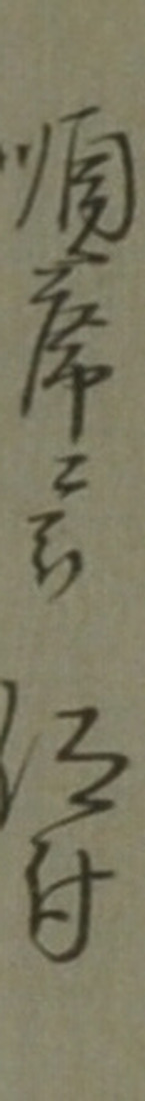順席ニ被仰付
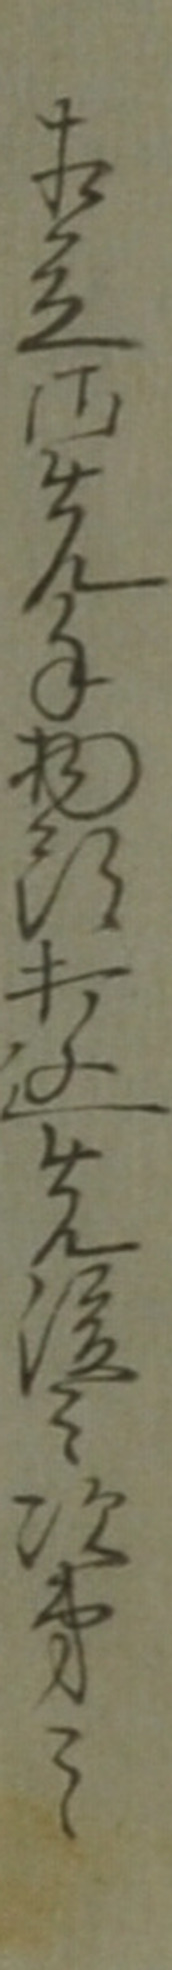相立御先手物頭打込先後之次第之
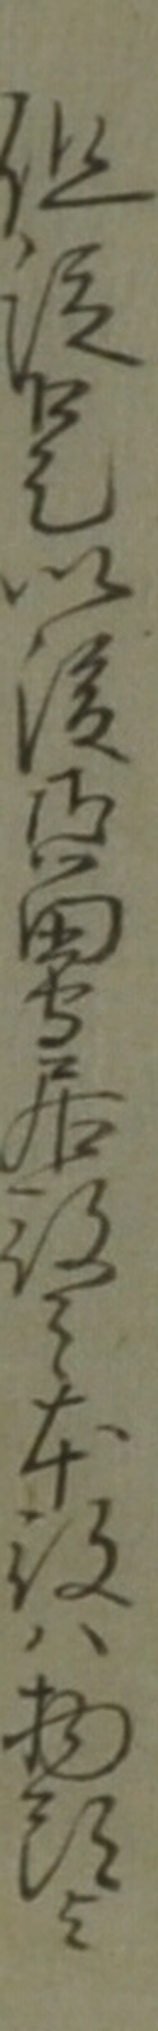但従是以後御留守居役之本役ハ物頭与
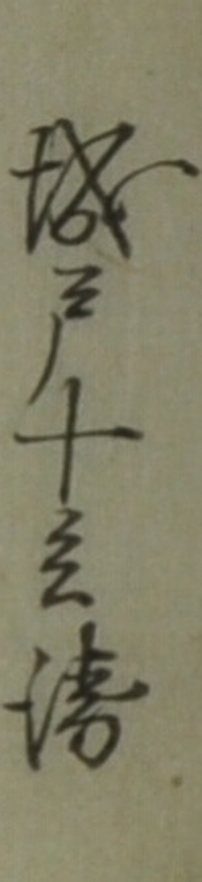城戸十兵衛

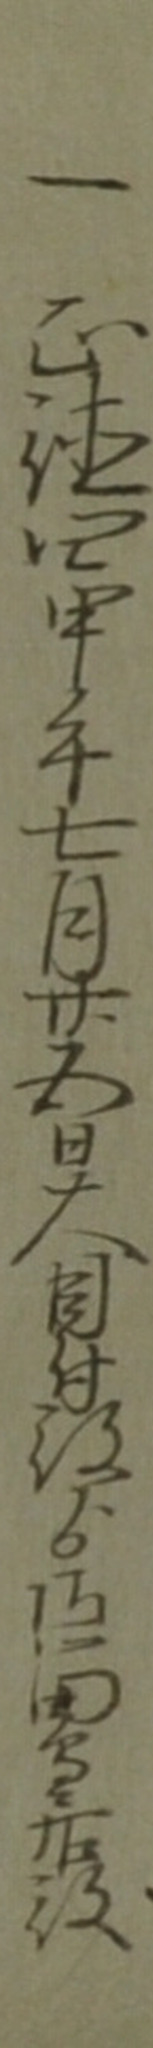一正徳四甲午七月廿五日大目付役ゟ御留守役
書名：諸御役代々録（三）
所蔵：伊那市立高遠町図書館・合同会社AMANE
